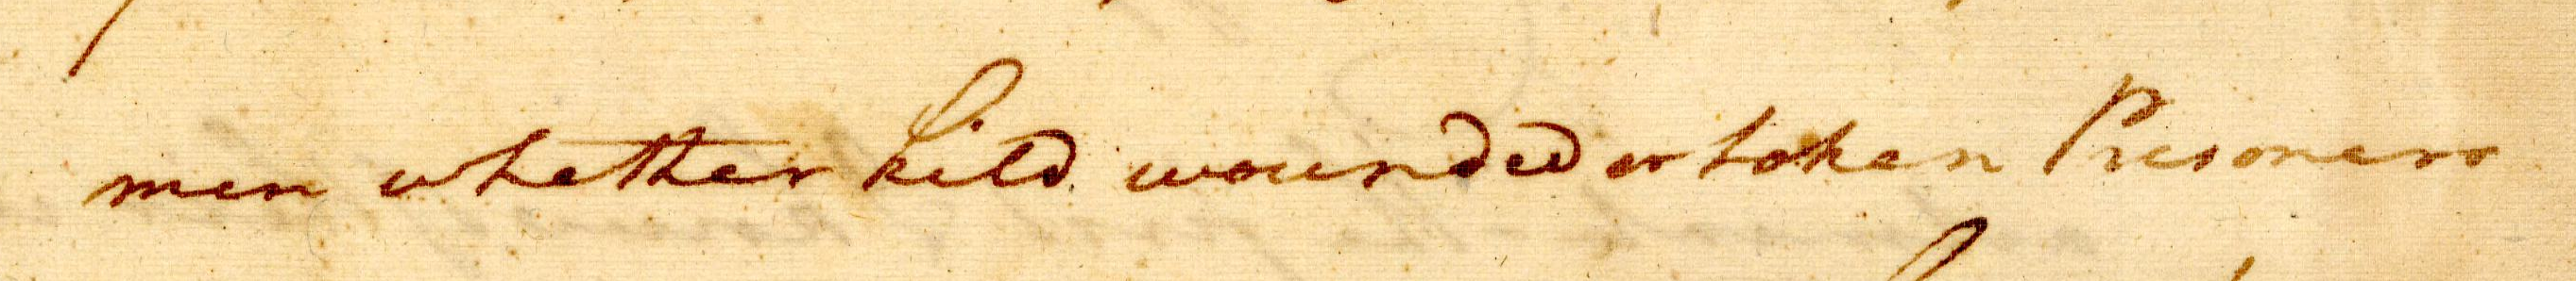men whether kild wounded or taken Prisoner
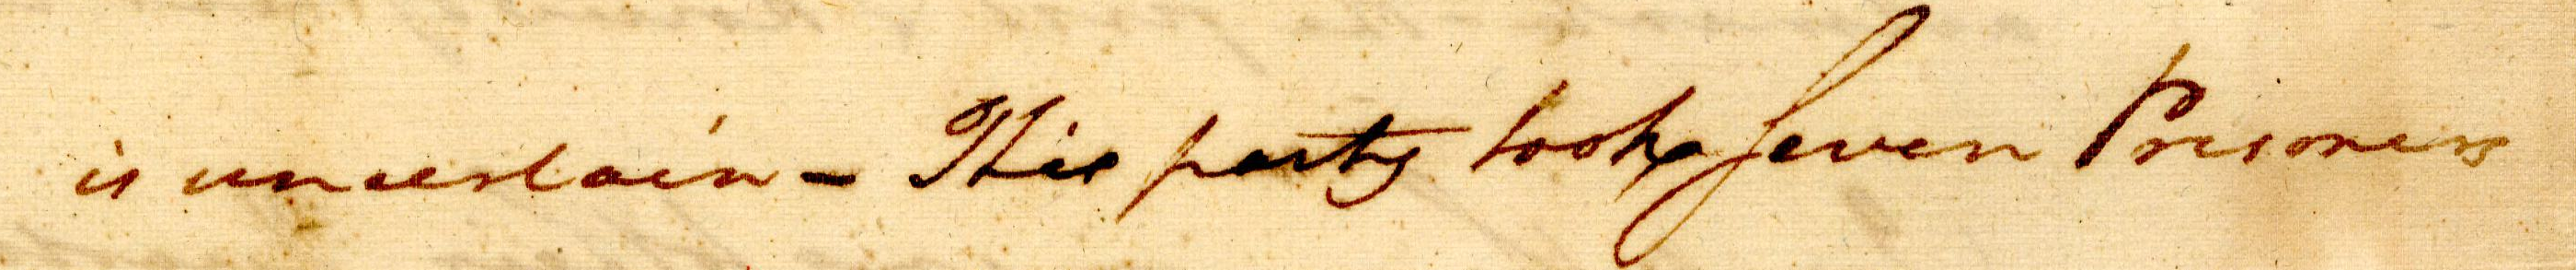is uncertain- This party took Seven Prisoners
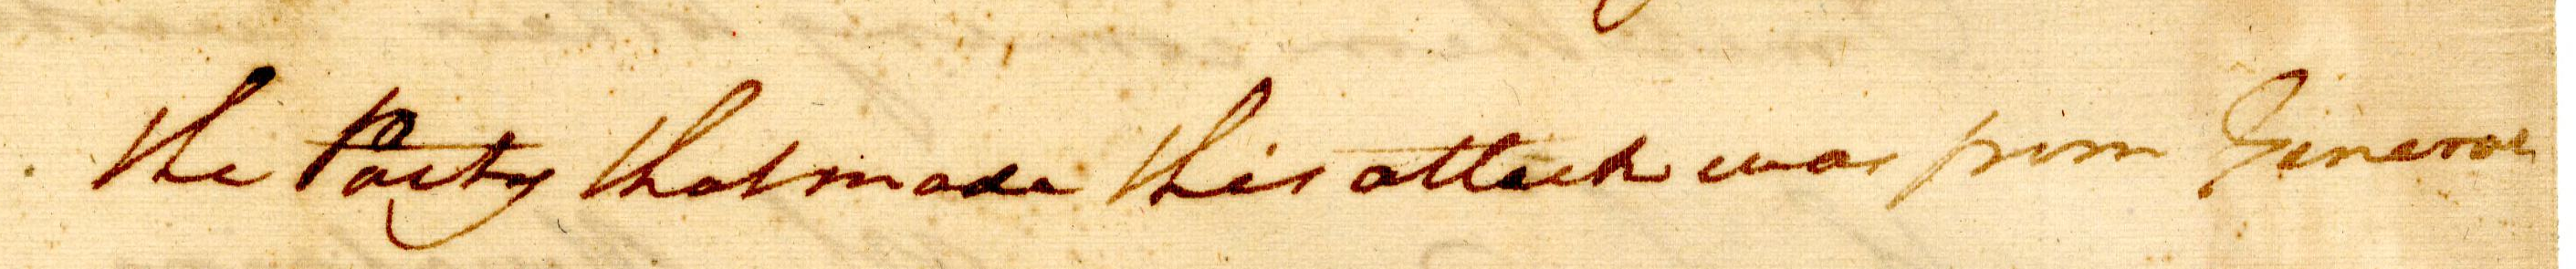the Party that made their attack was from General
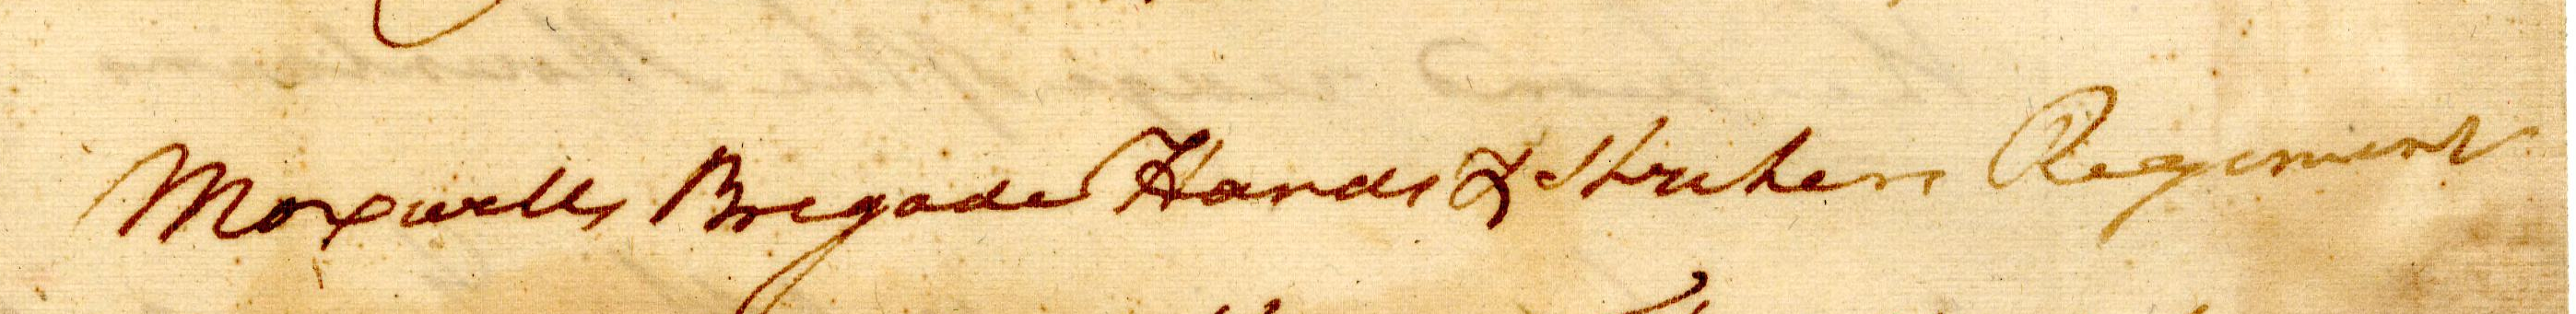Maxwells Brigade Hands & Strikers Regiment
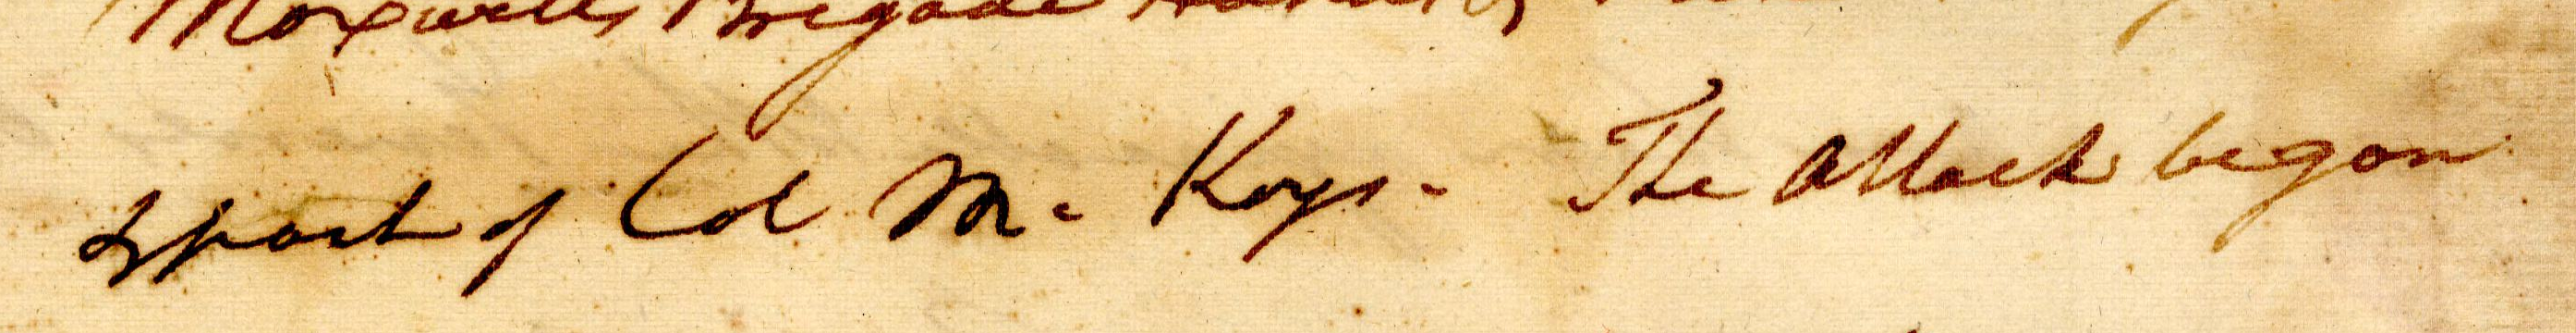& part of Col M. Keys. The attack began
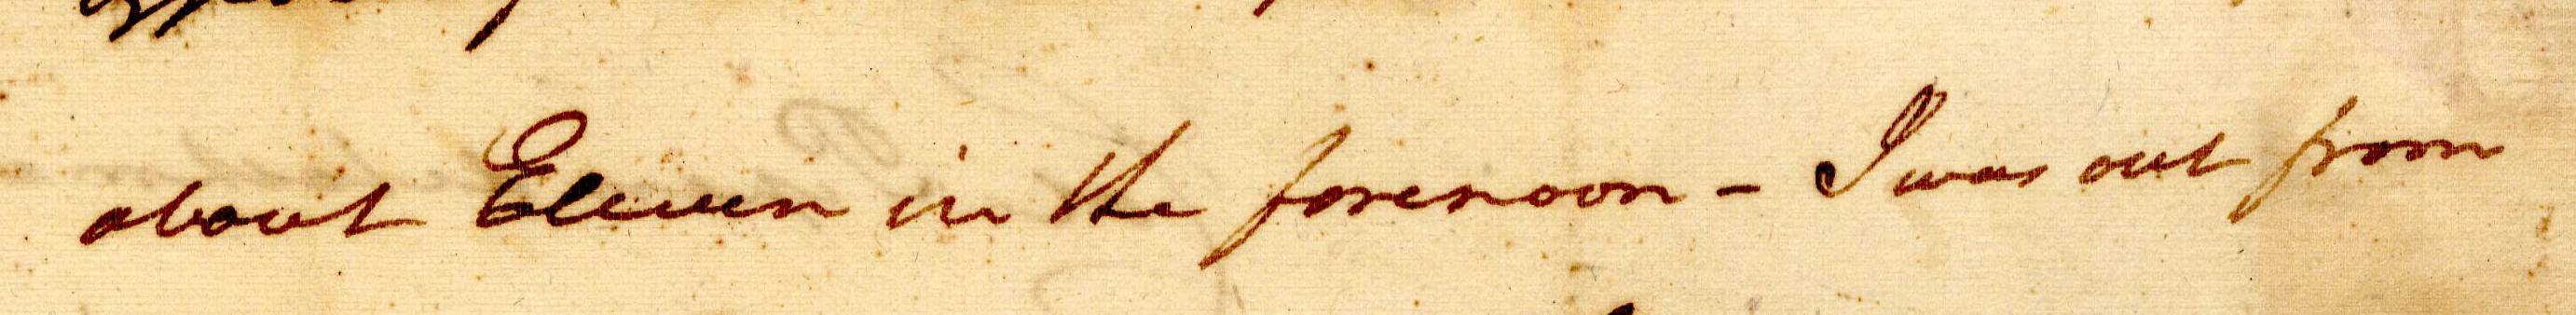about Eleven in the forenoon- I was out from
